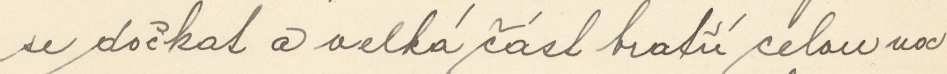se dočkat a velká část bratří celou noc
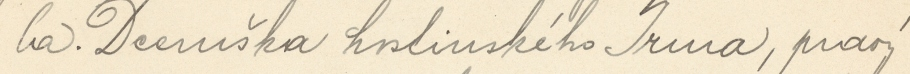la. Dceruška hostinského Irma, pravý
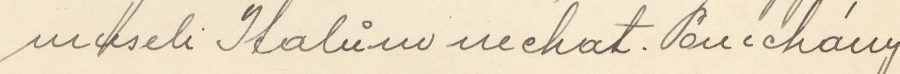museli Italům nechat. Ponechány
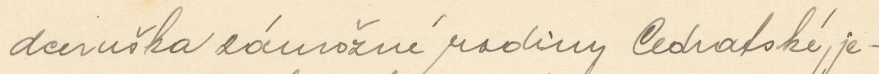dceruška zámožné rodiny Cedratské, je-
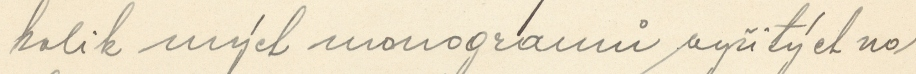kolik mých monogramů vyšitých na
